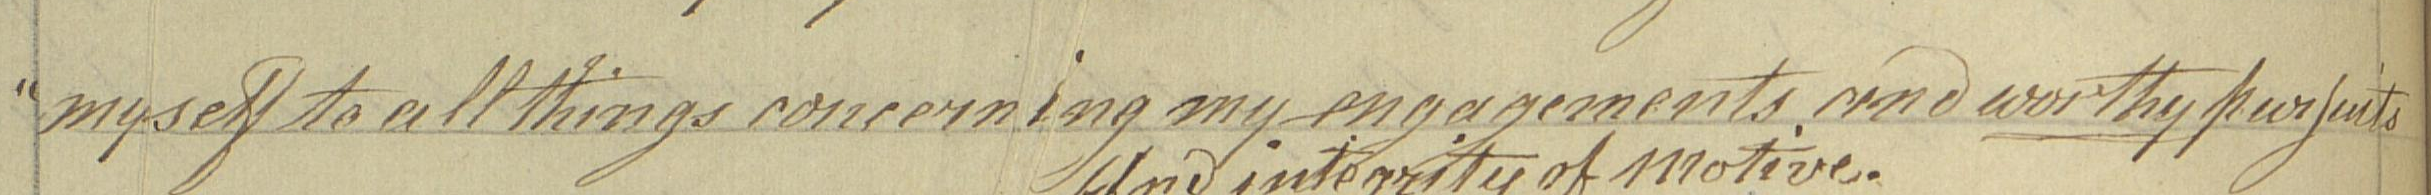"myself to all things concerning my engagements, and worthy pursuits
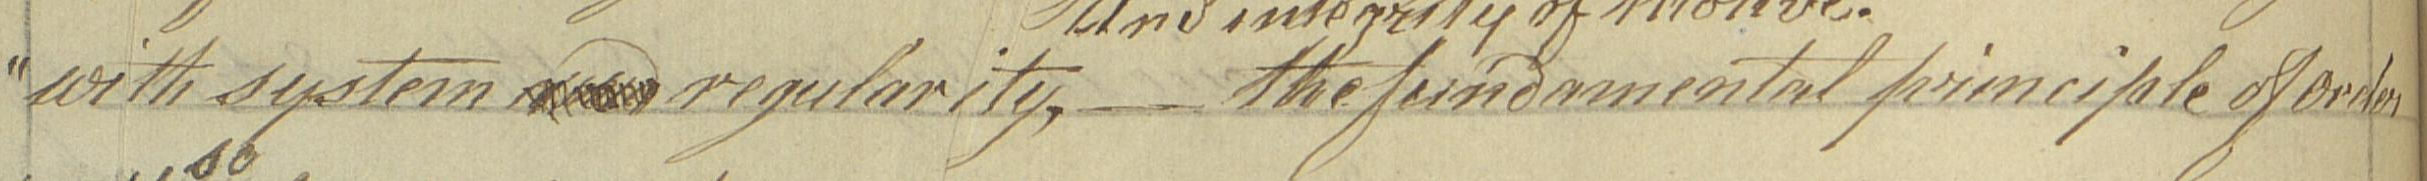"with system abd regularity, ^ the fundamental principle of Order
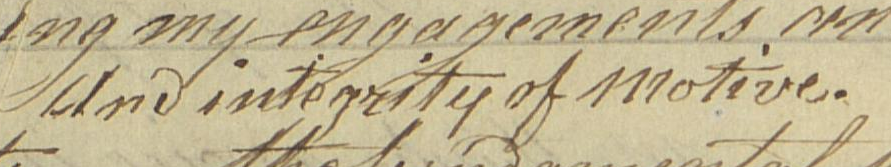And integrity of motive.
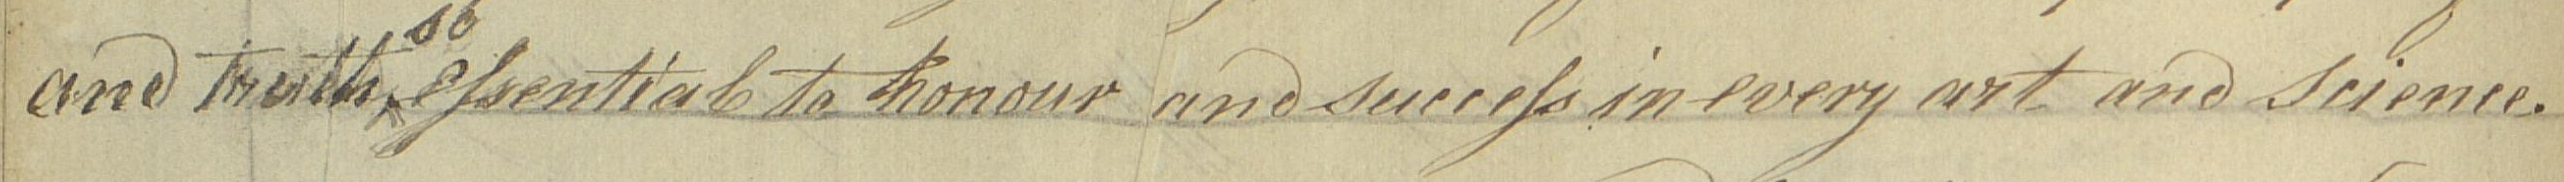and truth ^ Essential to honour and success in every art and Science.
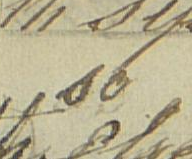so
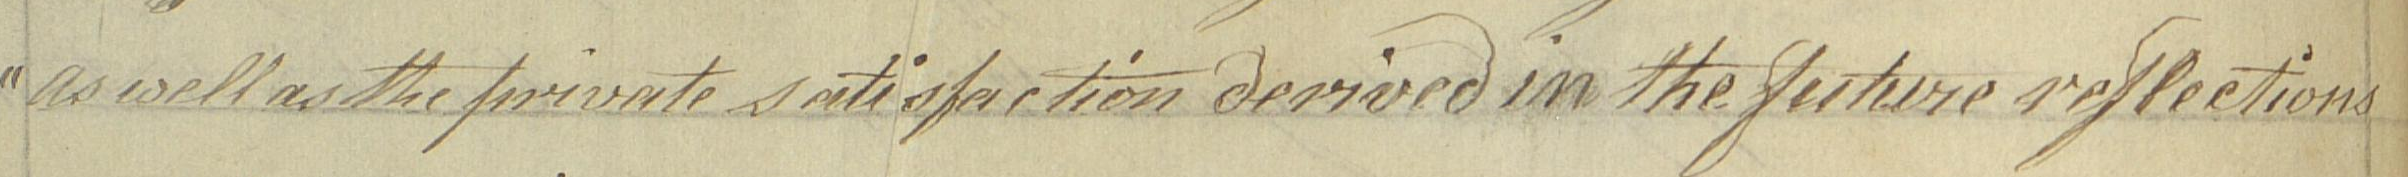"as well as the private satisfaction derived in the future reflections
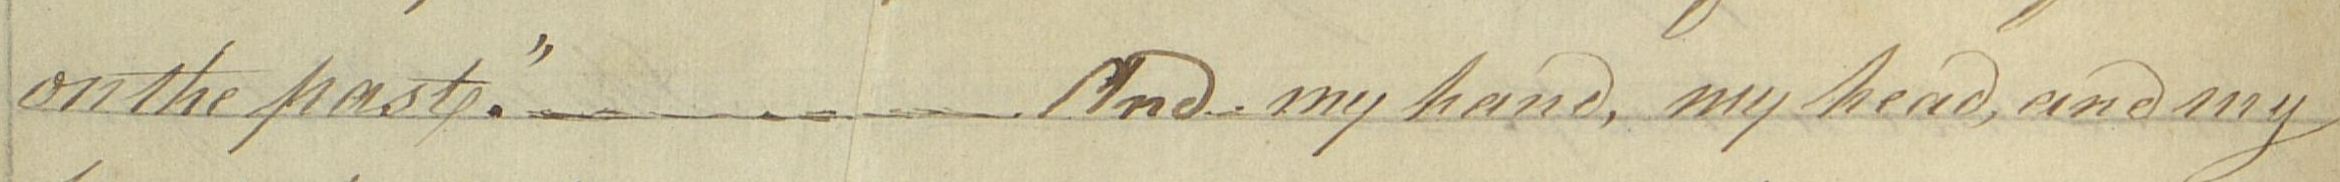on the past." And my hand, my head and my
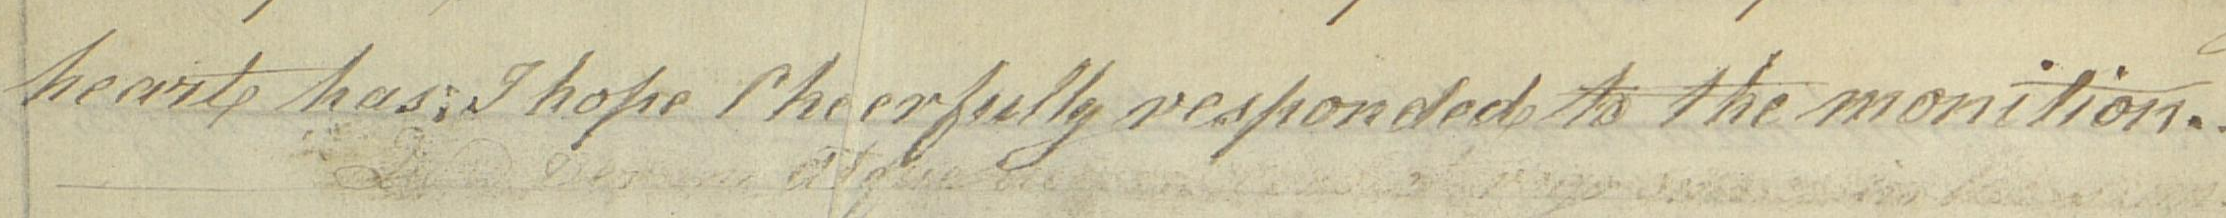heart has I hope Cheerfully responded to the monition.
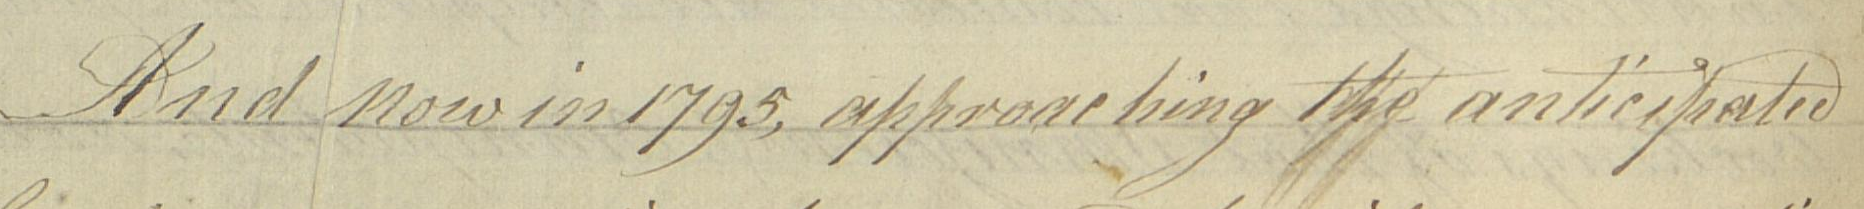And now in 1795 approaching the anticipated
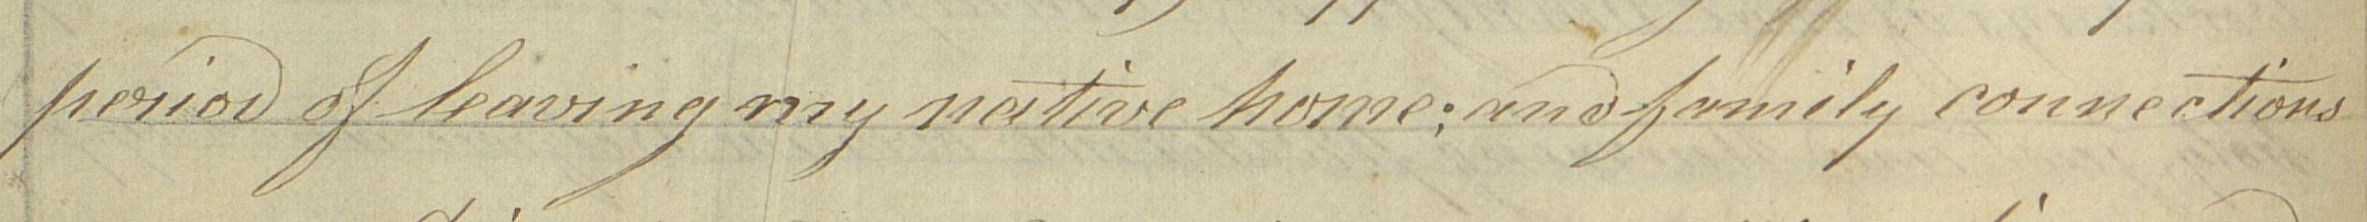period of leaving my native home; and family connections
